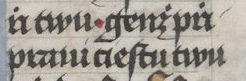pravi ceſtu twu
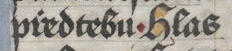pṙed tebu.Hlas
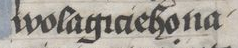wolagicíeho na¬
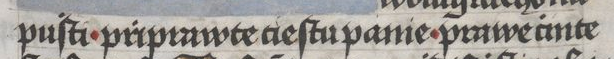puẛti.pṙiprawte cieſtu panie.prawe ċinte
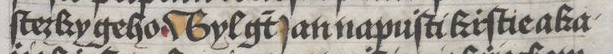ſtezky geho.ſyl ḡt Ian na puẛti kṙſtie a ka¬
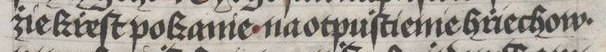żie kṙeſt pokanie.na otpuẛtiene hṙíechow.
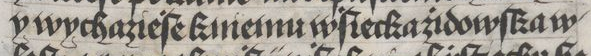y wychazieẛe k niemu wẛiecka żidowſka w¬
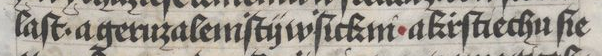laſt.a geruzalemẛtí wẛickni.a kṙſtíechu ſie
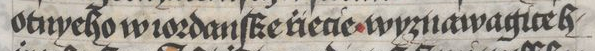ot nyeho w iordarſke ṙiecíe.wyznawagíce h¬
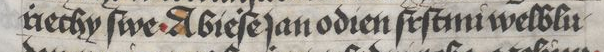ṙieċhy ſwe. A bíeẛe Ian odien ſrſtmi welbu¬
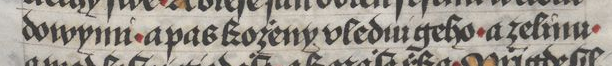dowymi.a pas kożeny v ledví geho.a zelinu.
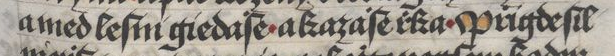a med leſni gíedaẛe.a kazaẛe ṙka.Pṙigde ſil¬
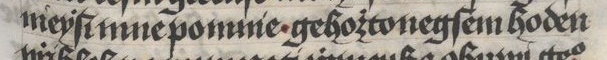nieyẛí mne po mne.gehożto negſem hoden
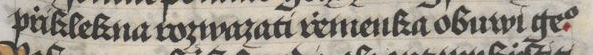pṙiklekna rozwazati ṙemenka obuwi geo
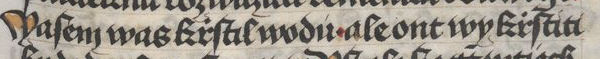Ya ſem was kṙſtil wodu.ale ont wy kṙẛtiti
